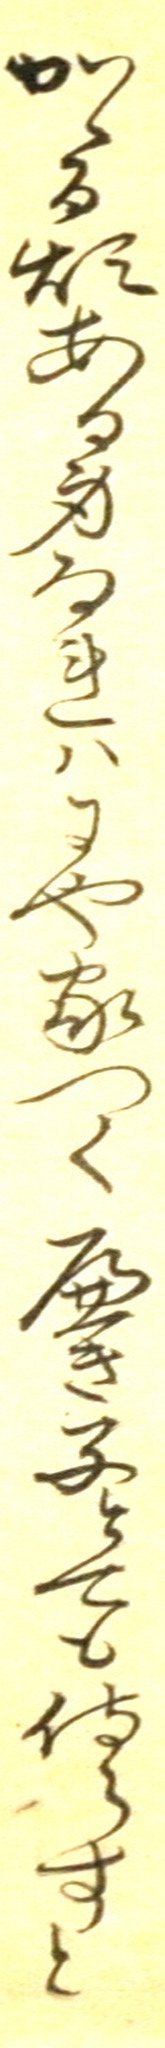かゝる煩ある身なれはにや家つくへき子とても侍らすと
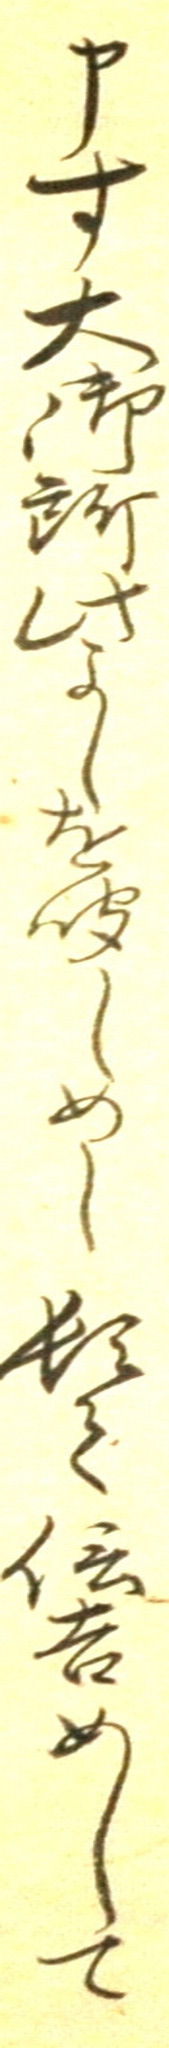申す大御所此よしを聞しめし頓て信吉めして
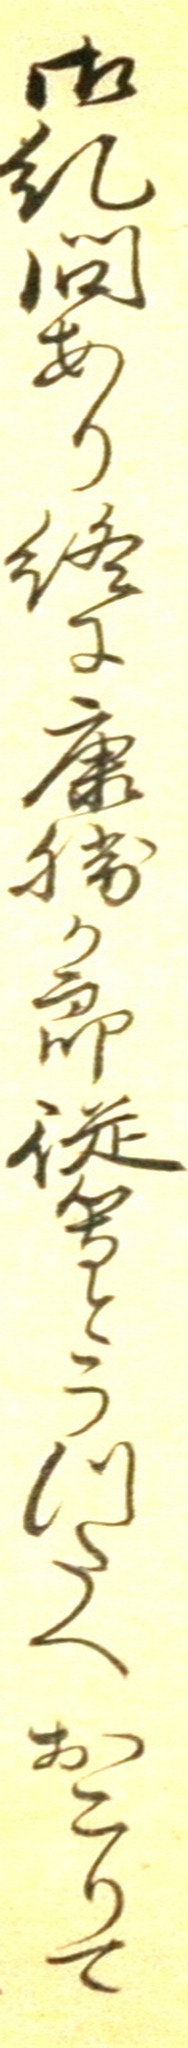御糺問あり終に康勝か郎従等とうつたへおこりて

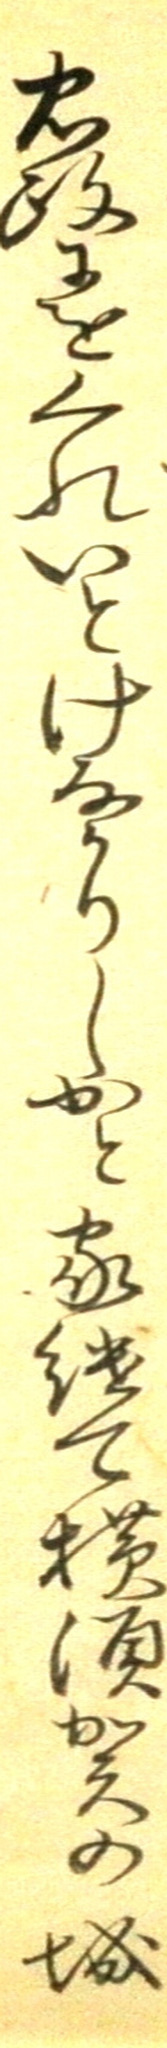忠政にをくれいとけなかりしかと家継て横須賀の城
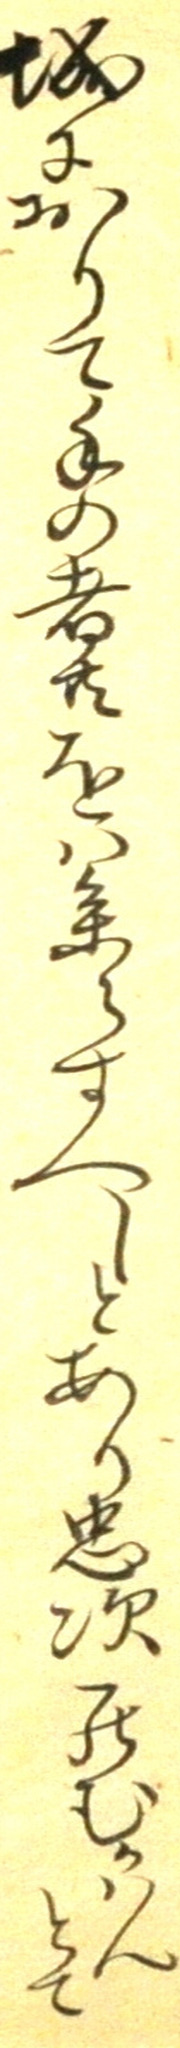城におりて手の者共をは参らすへしとあり忠次罷むかはんとて
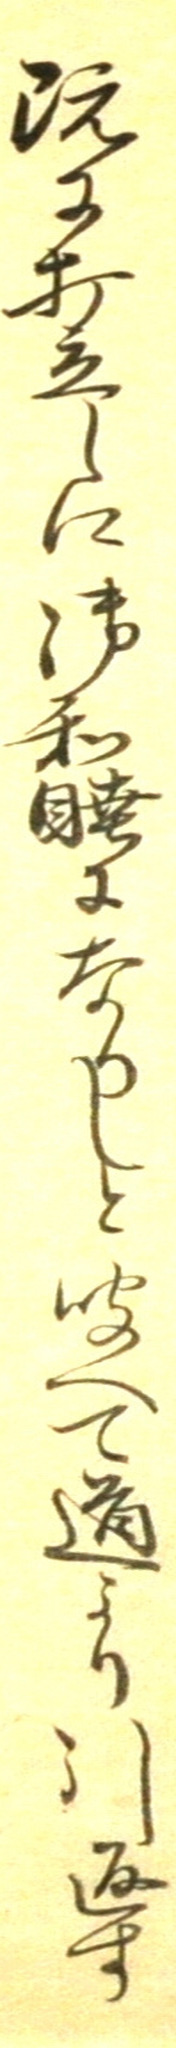既に打立しに御和睦になりしと聞へて道より引返す
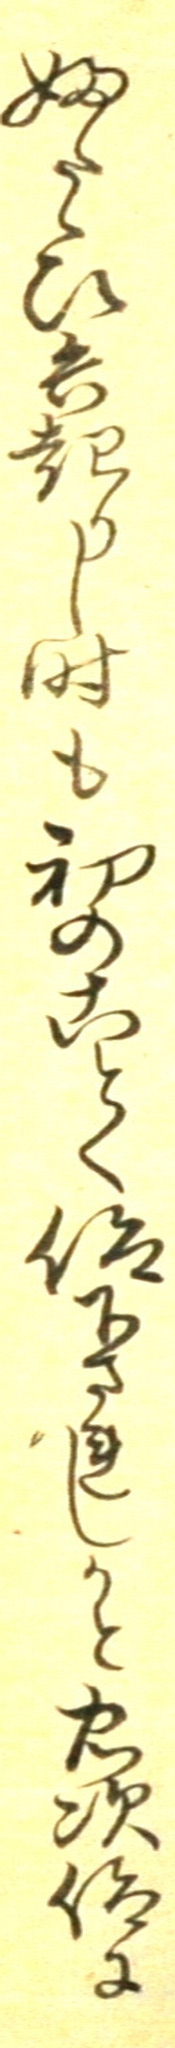ふたゝひ兵起りし時も初のことく仰下されしかと忠次仰に
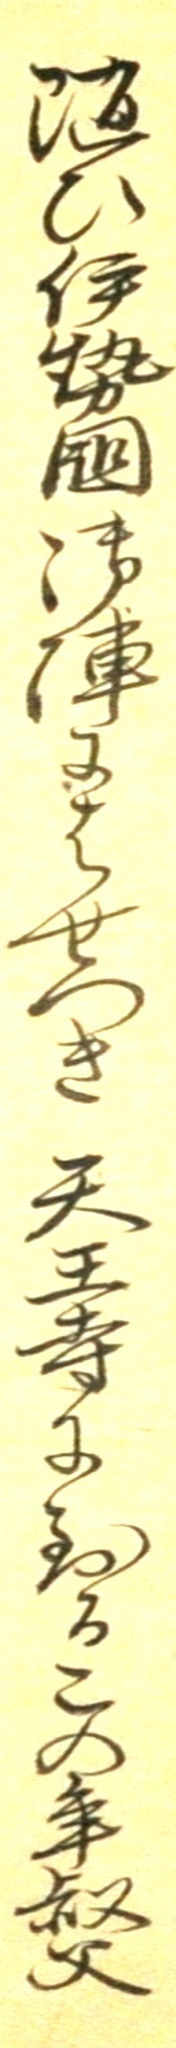随ひ伊勢国御陣にはせつき天王寺に到るこの年叔父
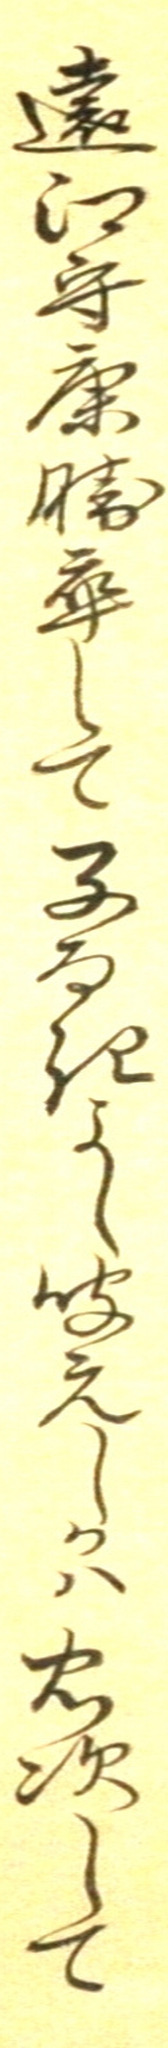遠江守康勝卒して子なきよし聞えしかは忠次して
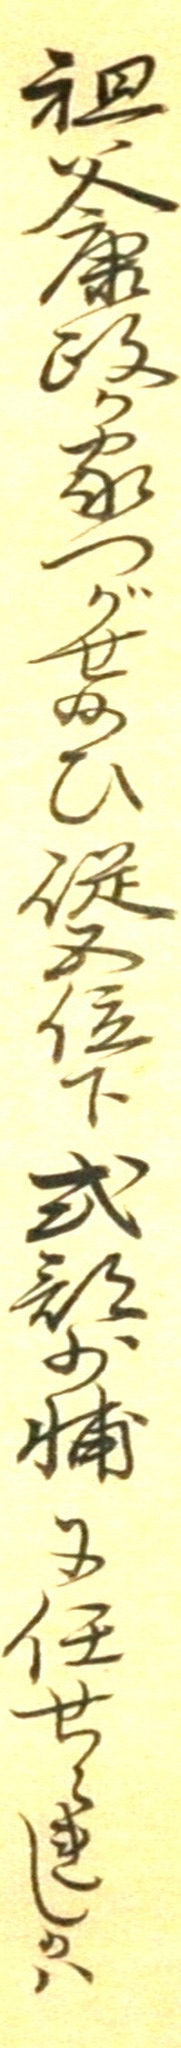祖父康政か家つがせ給ひ従五位下式部少輔に任せられしかは
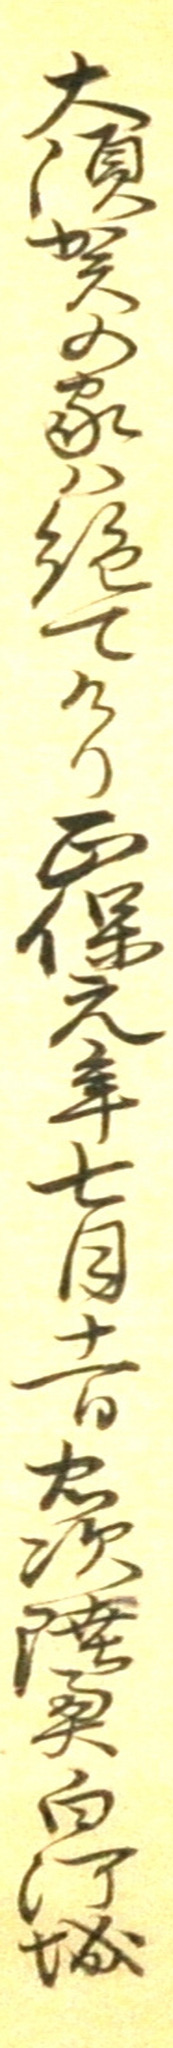大須賀の家は絶てけり正保元年七月十一日忠次陸奥白河城
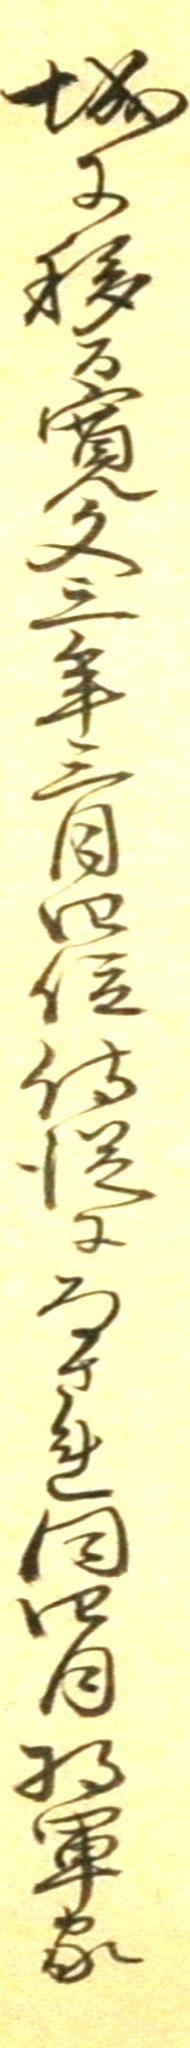城に移る寛文三年三月四位侍従になされ同四月将軍家
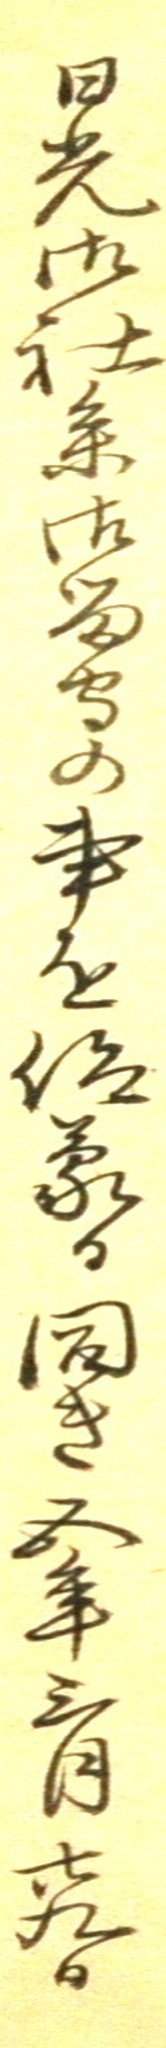日光御社参御留守の事を仰蒙る同き五年三月廿九日
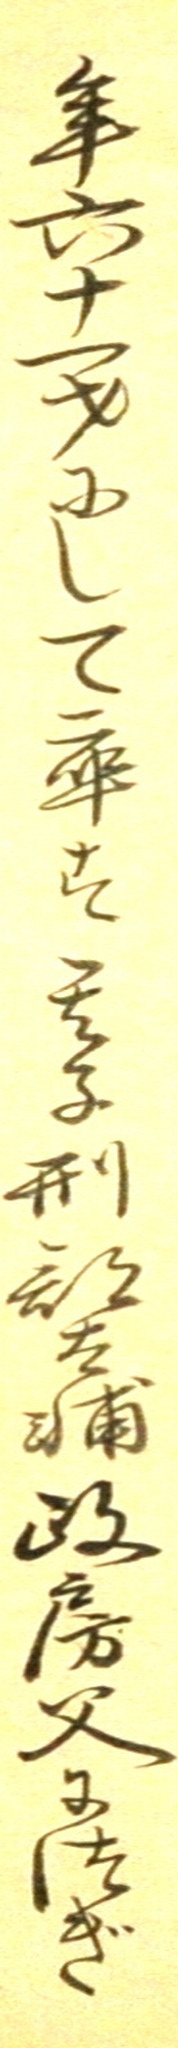年六十一才にして卒す其子刑部太輔政房父につぎ
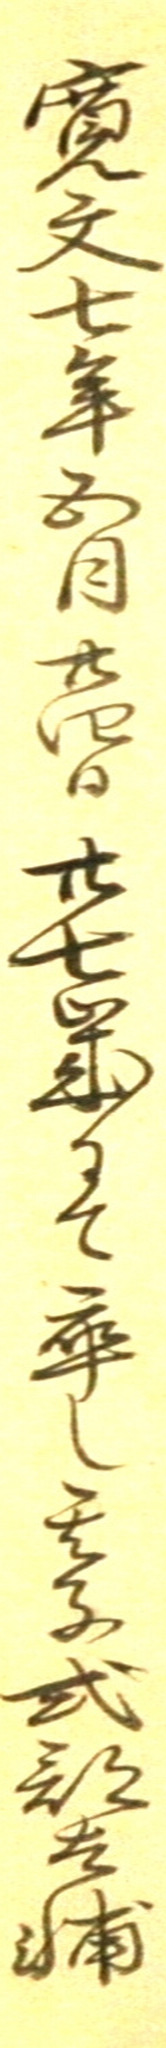寛文七年五月廿四日廿七歳にて卒し其子式部太輔
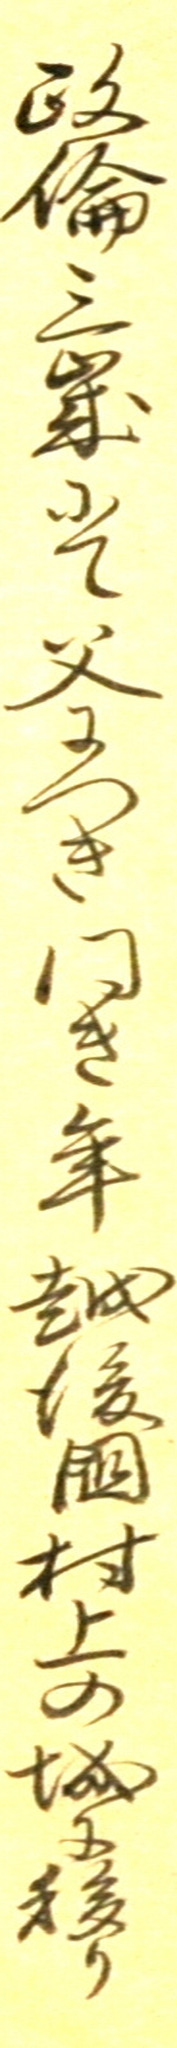政倫三歳にて父につき同き年越後国村上の城に移り
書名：藩翰譜（四・上）
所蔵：伊那市立高遠町図書館・合同会社AMANE
